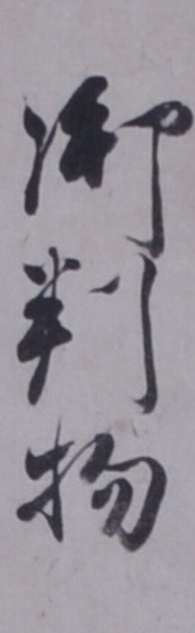御判物

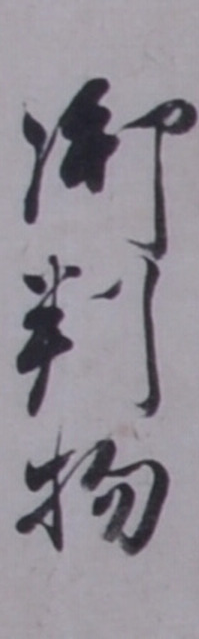御判物

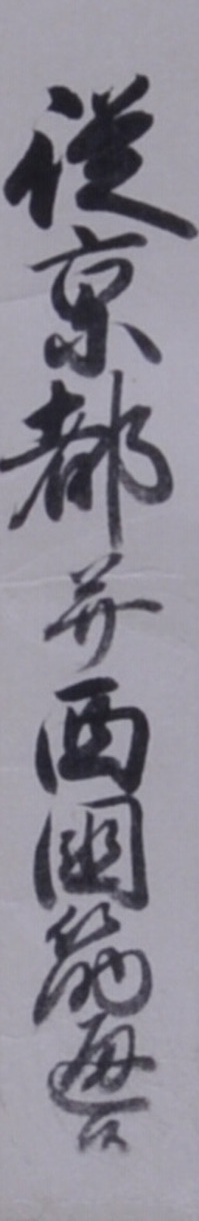従京都并西国筋通候
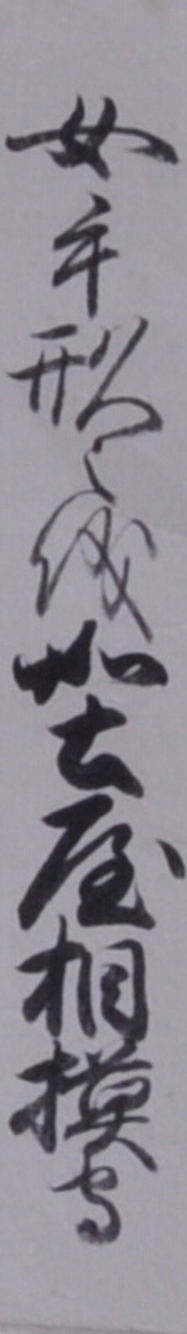女手形之儀如土屋相模守
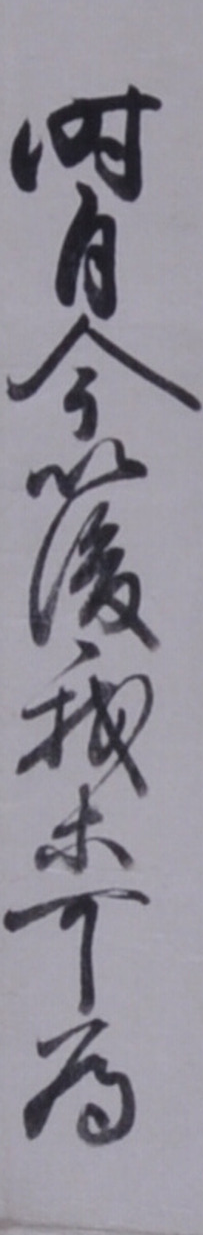時自今以後我等可為
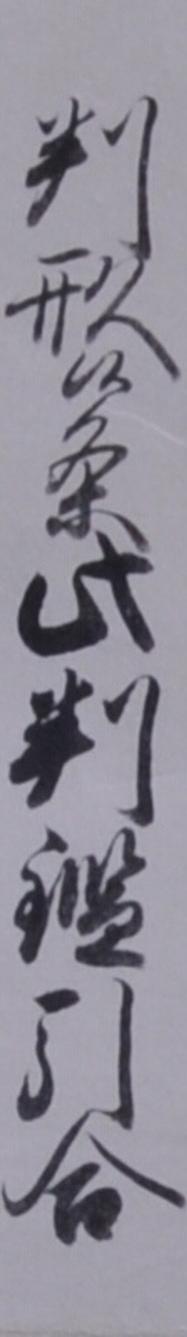判形候条此判鑑引合
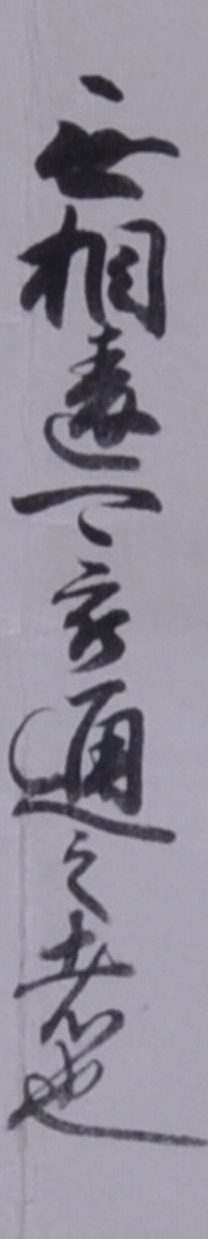無相違可被通之者也
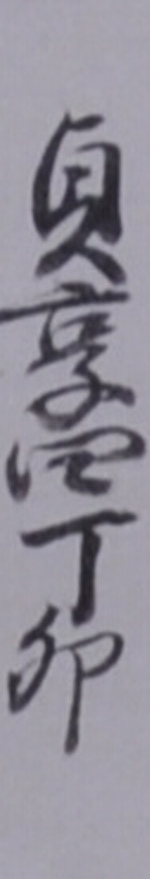貞享四丁卯
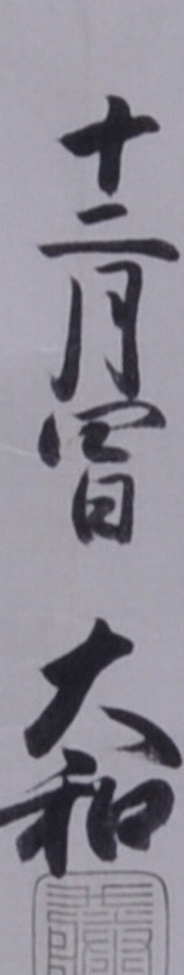十二月四日大和印
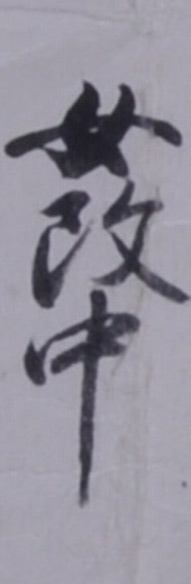女改中
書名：御判物
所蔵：伊那市立高遠町図書館・合同会社AMANE
